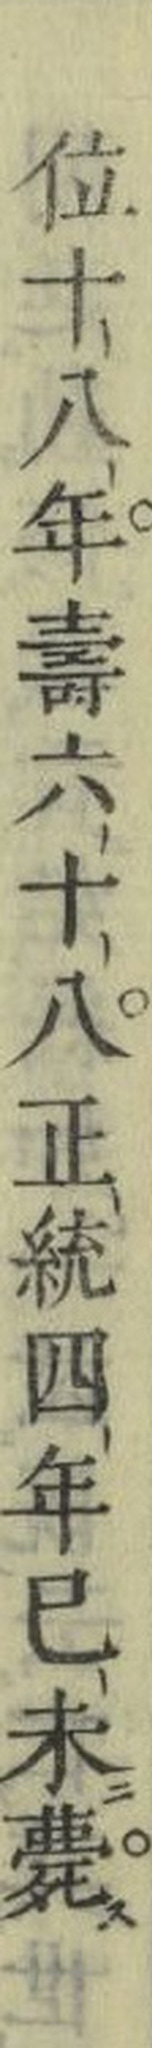位十-八-年。寿六-十-八。正-統四-年巳-未薨。

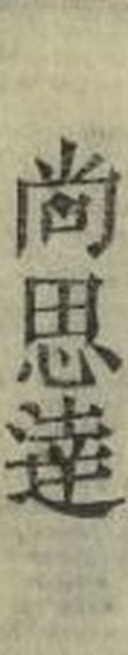尚思達
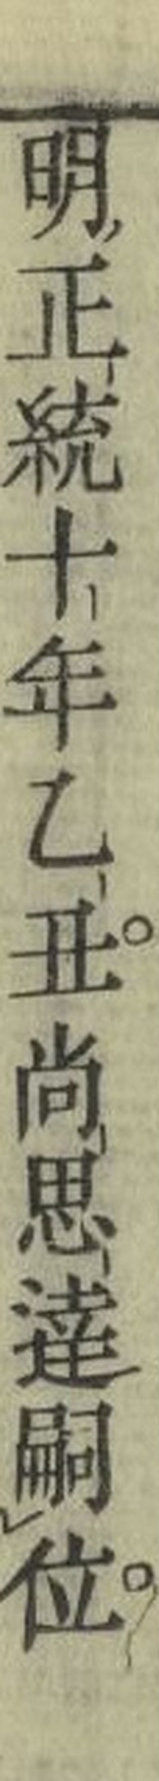明正-統十-年乙-丑。尚-思-達嗣位。

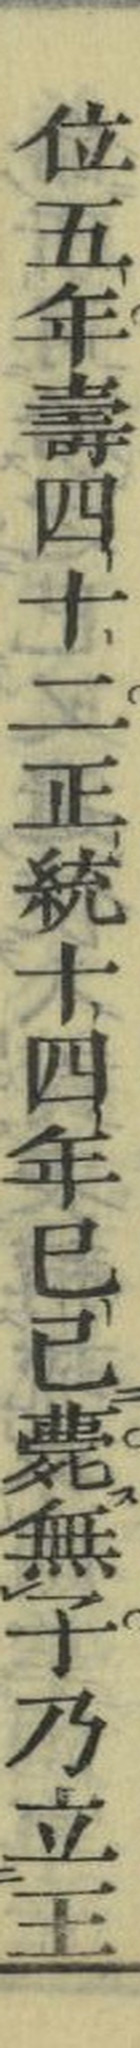位五-年。寿四-十-二。正-統十-四-年巳-已薨。無子。乃立王
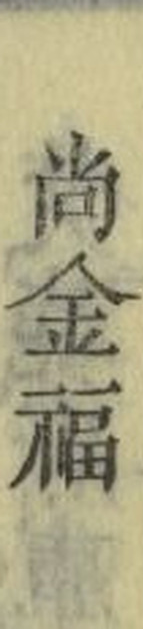尚金福

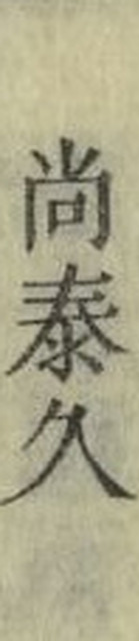尚泰久
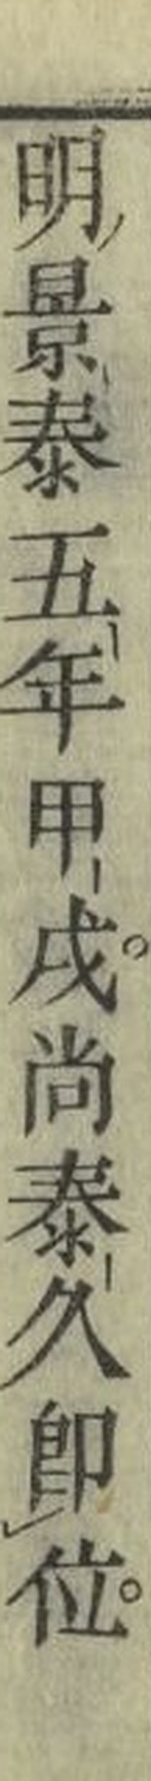明景-泰五-年甲-戌。尚泰-久即位。
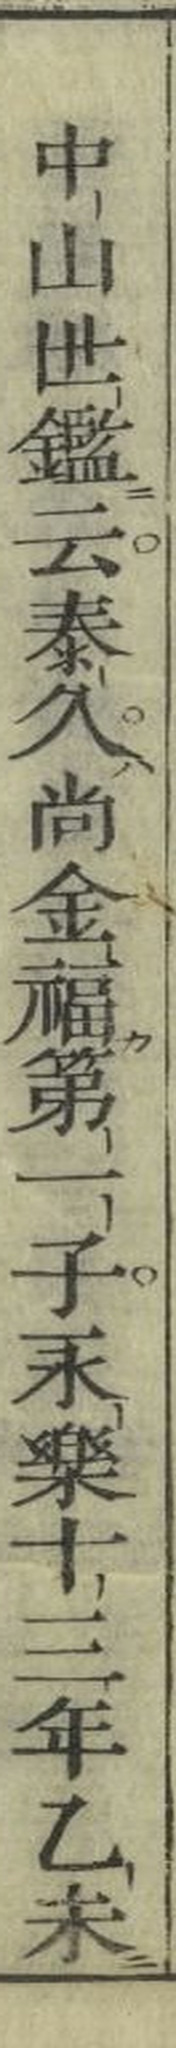中-山世-鑑云。泰-久。尚金-福第-一-子。永-楽十-三-年乙-未

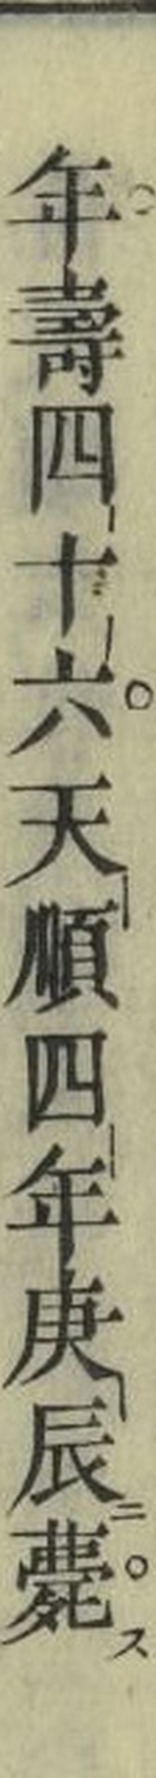年。寿四-十-六。天-順四-年庚-辰薨。

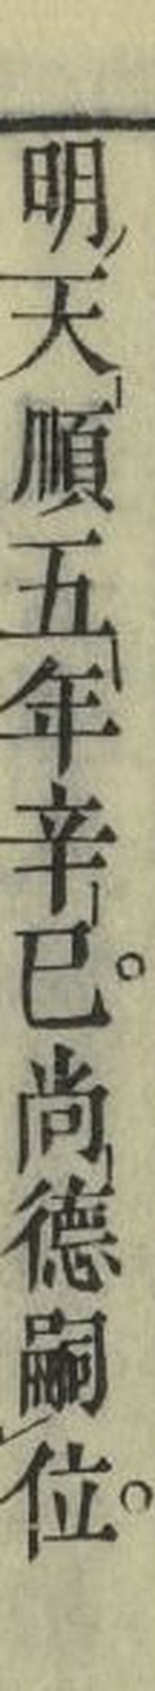明天-順五-年辛-巳。尚-徳嗣位。

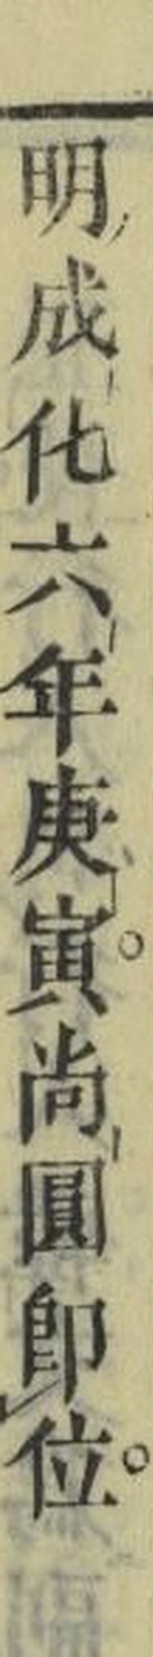明成-化六-年庚-寅。尚-円即位。

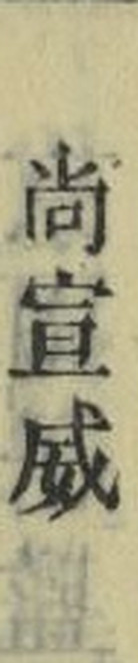尚宣威
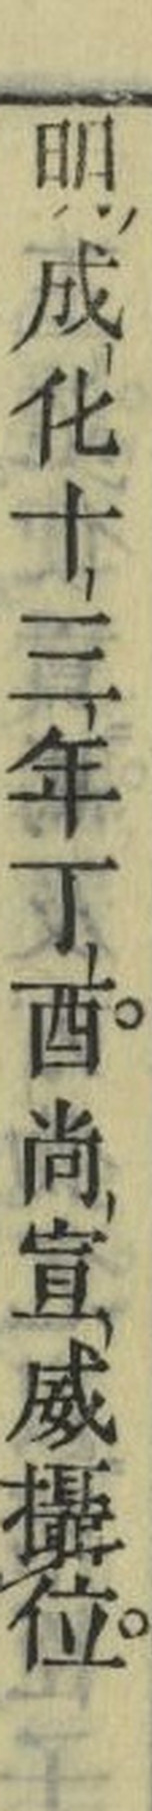明成-化十-三-年丁-酉。尚-宣-威摂位。
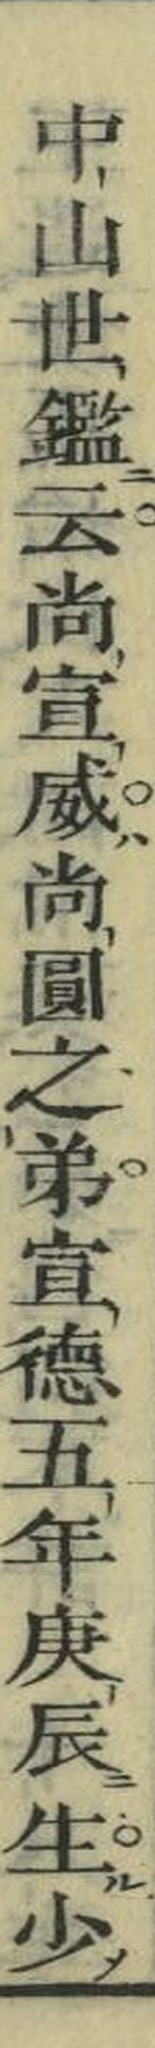中-山世-鑑云。尚-宣-威。尚-円之-弟。宣-徳五-年庚-辰生。少
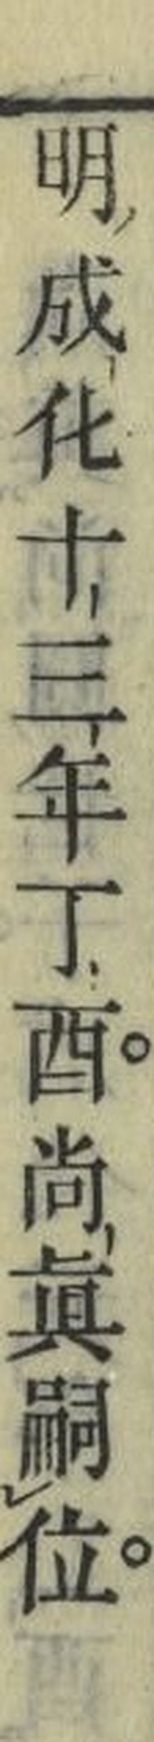明成-化十-三-年丁-酉。尚-真嗣位。

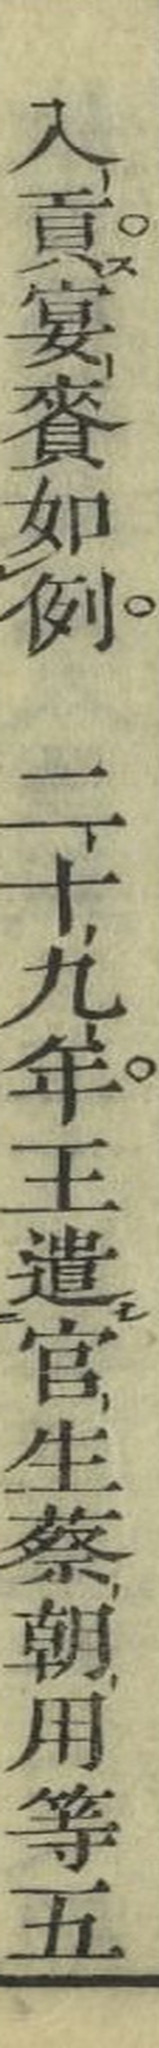入-貢。宴-賚如例。二-十-九-年。王遣官-生蔡-朝-用等五
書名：中山伝信録 巻三
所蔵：University of the Ryukyus Library
